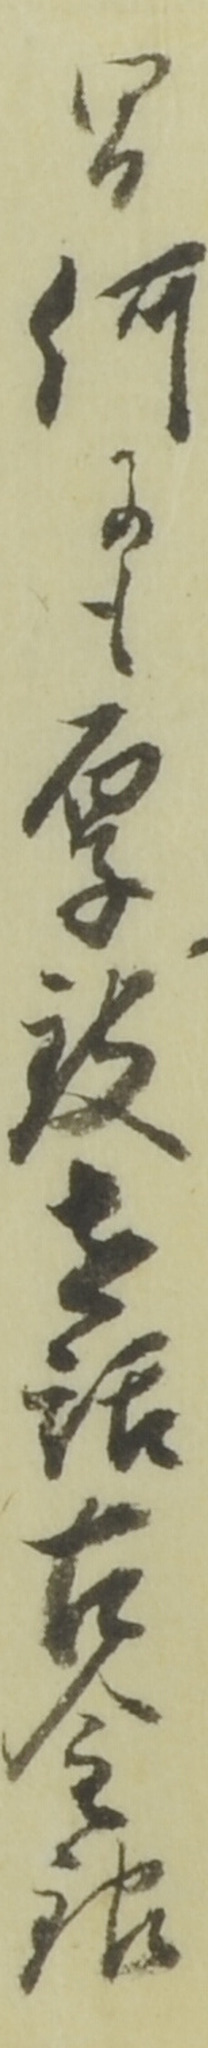間何にも厚致世話古金銀
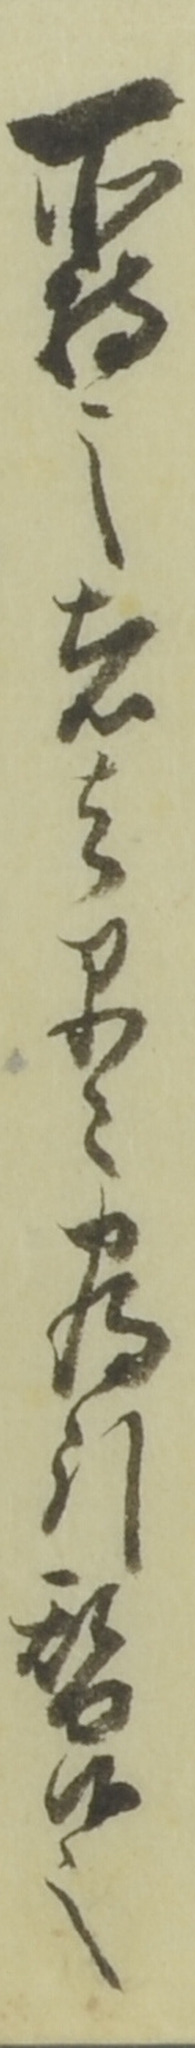所持之者は早々為引替候之
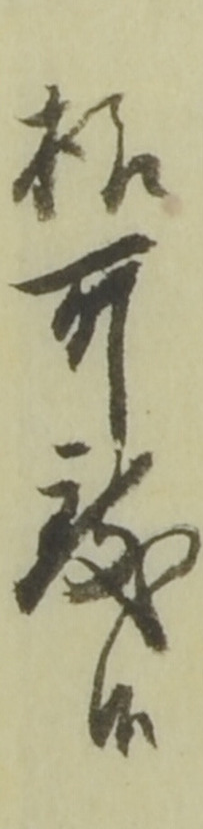様可致候
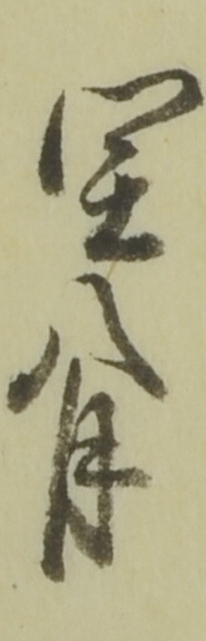閏八月
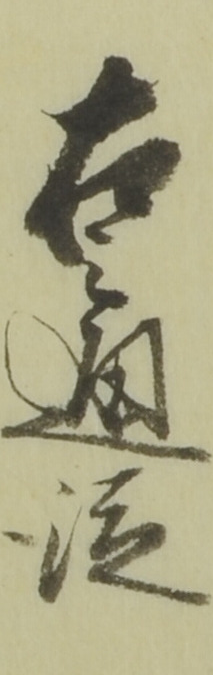右之通従
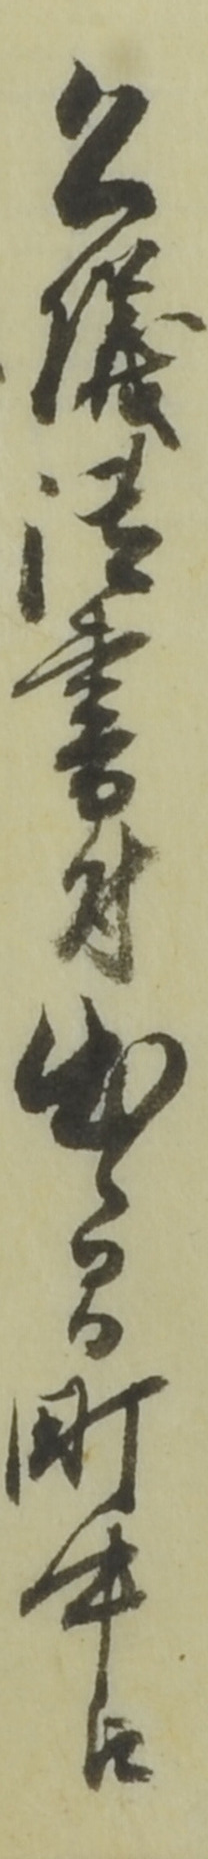公儀御書付出候間町中江
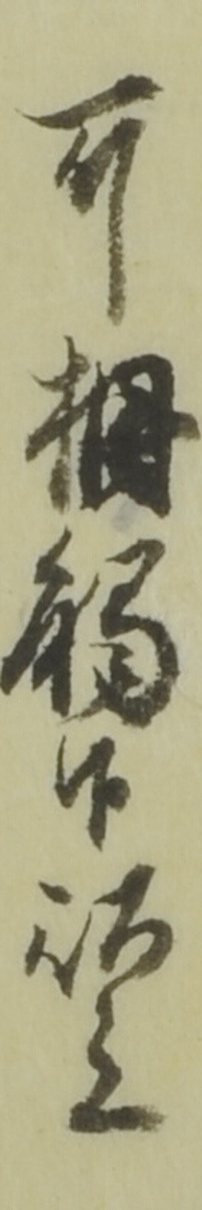可相触候以上
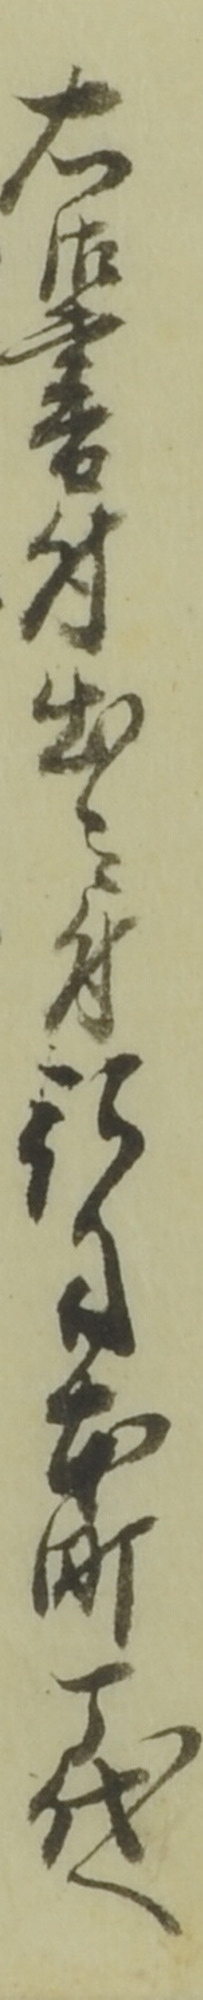右御書付出候ニ付行司本町丁代へ
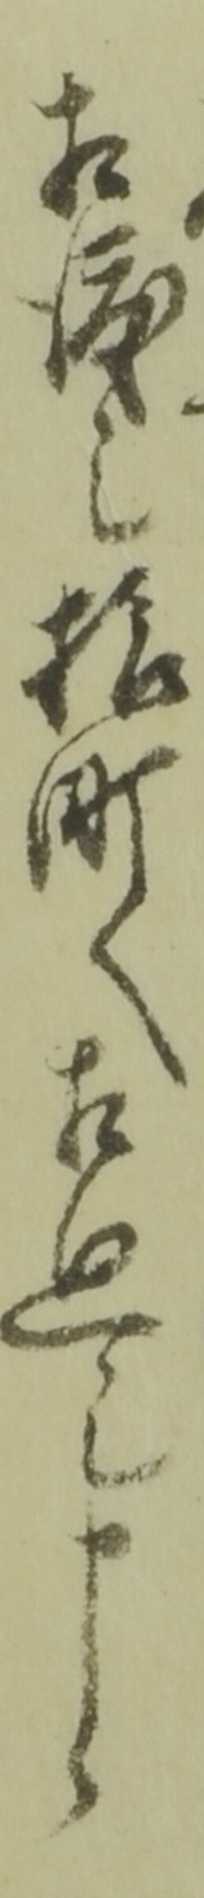相渡シ拾町へ相廻シ申候
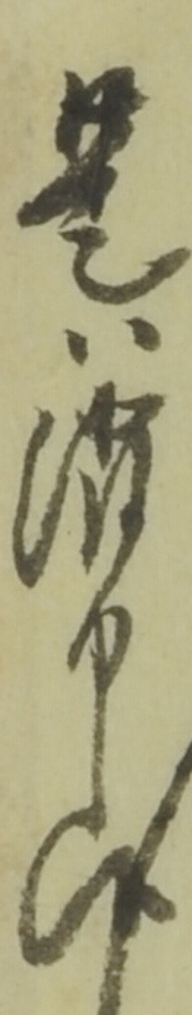是ハ消申候

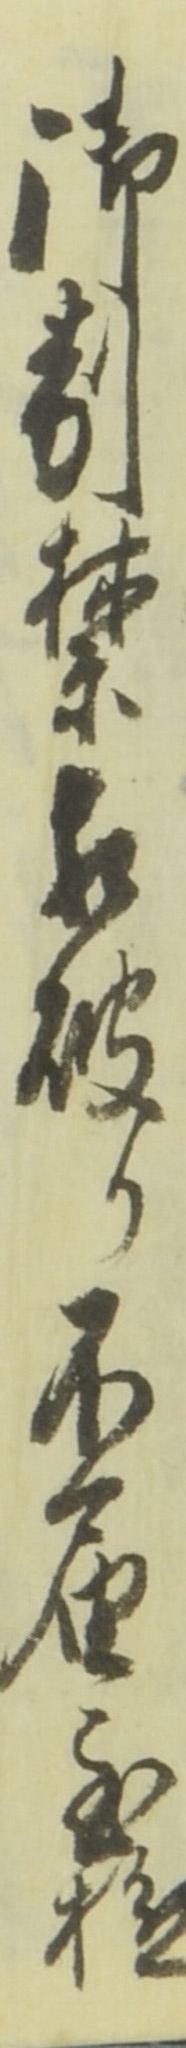御制禁相破り不届至極
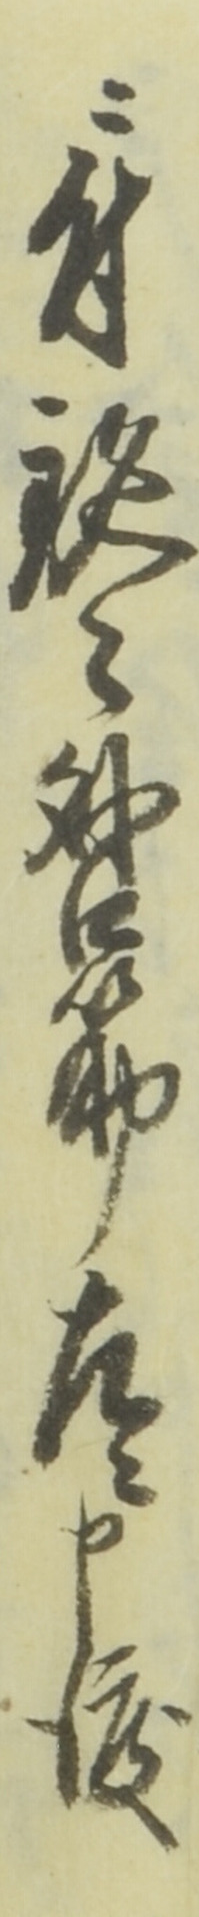ニ付銘々咎筋左ニ申渡
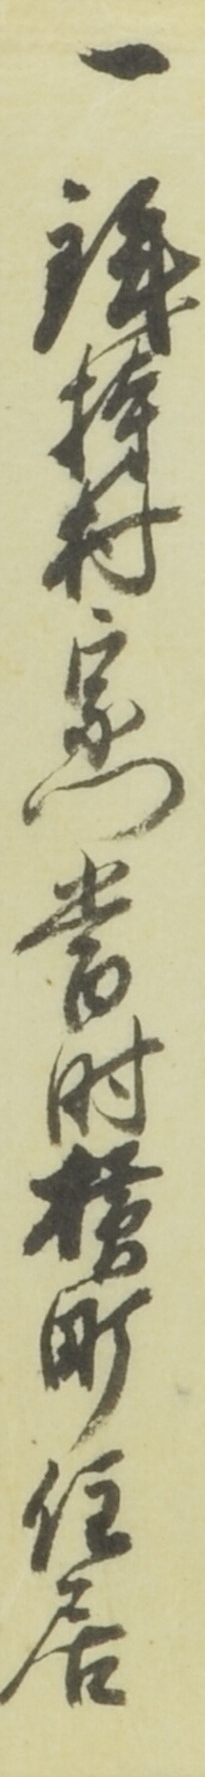一鉾持村宗門当村横町住居
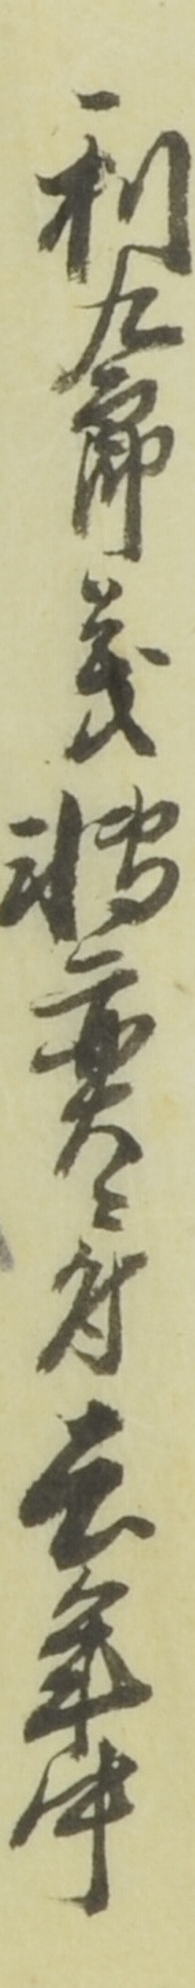利九郎義博奕ニ付去年中
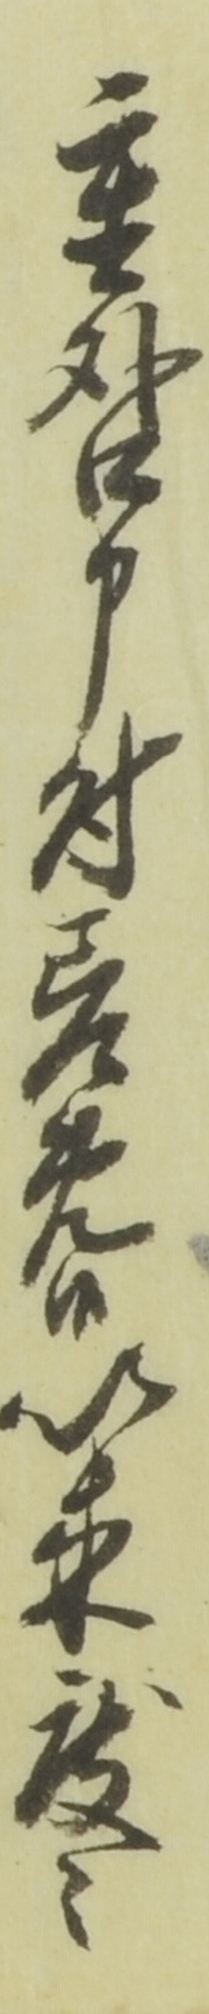重咎申付差免候以来度々
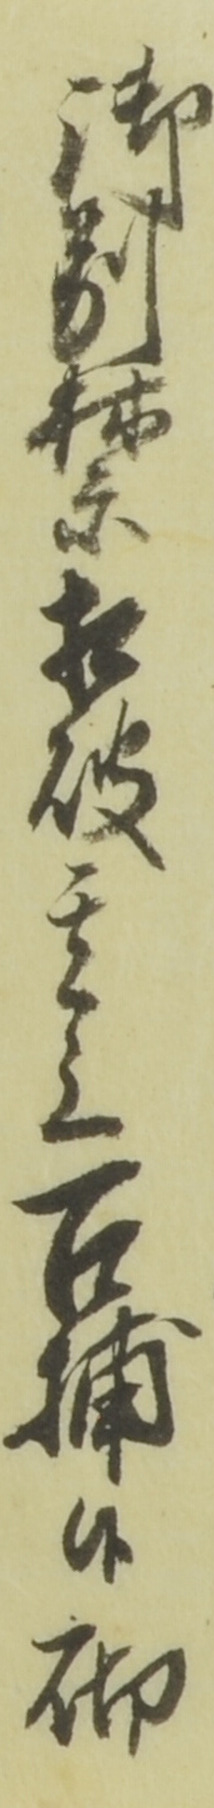御制禁相破其上召捕候砌
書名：御触書御書附控
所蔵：伊那市立高遠町図書館・合同会社AMANE
